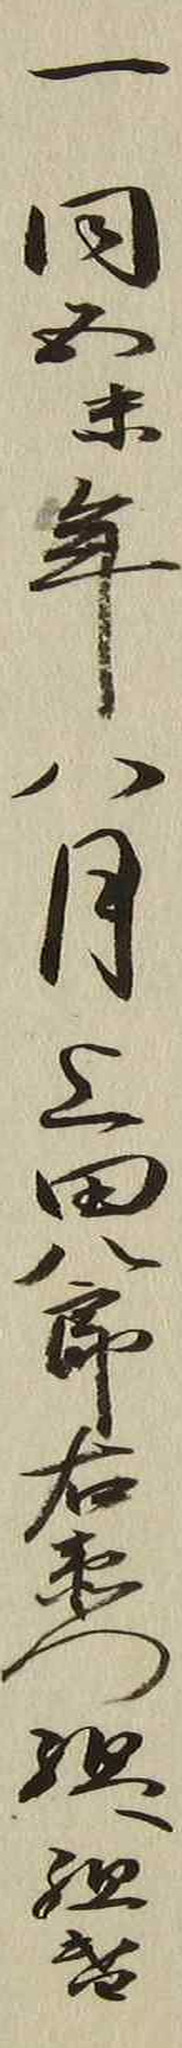一同五未年八月上田八郎右衛門組へ組替
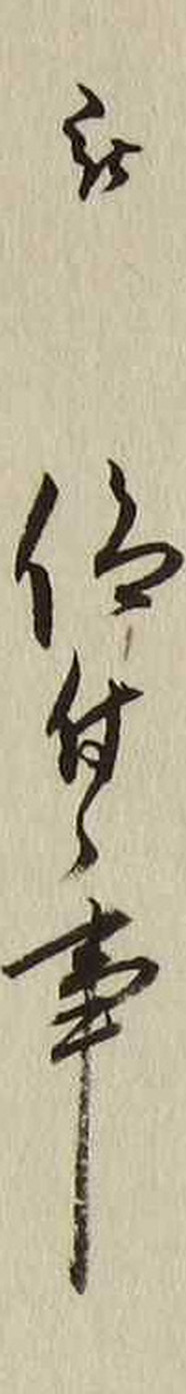被仰付候事
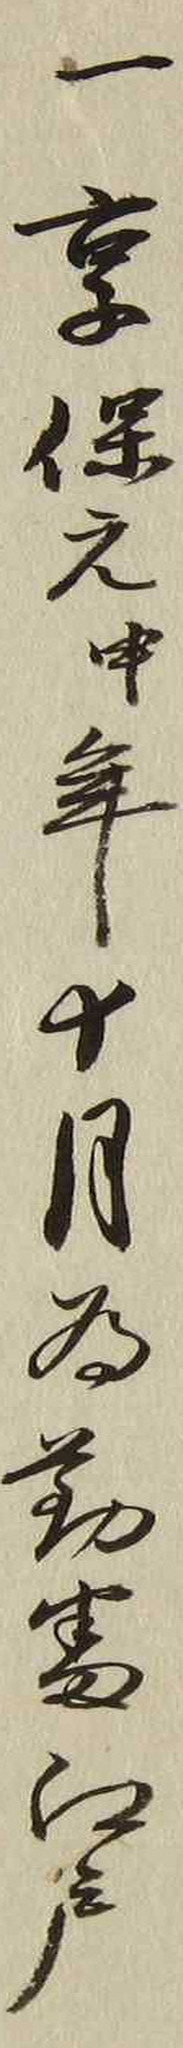一享保元申年十月為勤番江戸
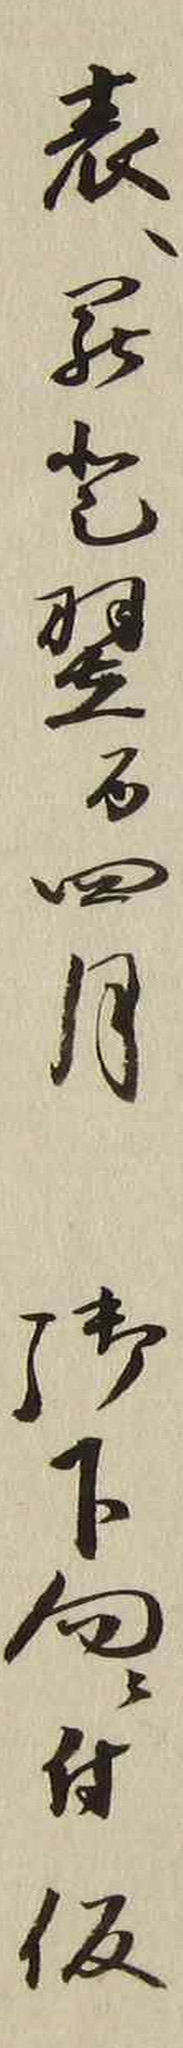表へ罷登翌酉四月御下向ニ付仮
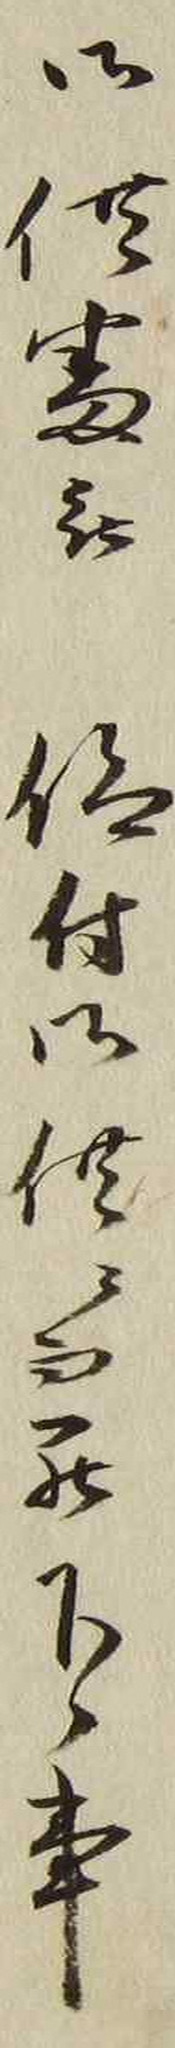御供番被仰付御供ニ而罷下候事
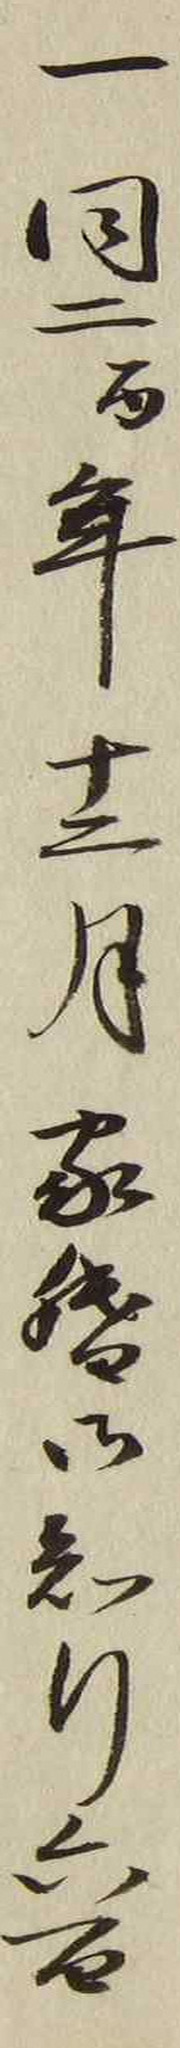一同二酉年十二月家督御知行六百
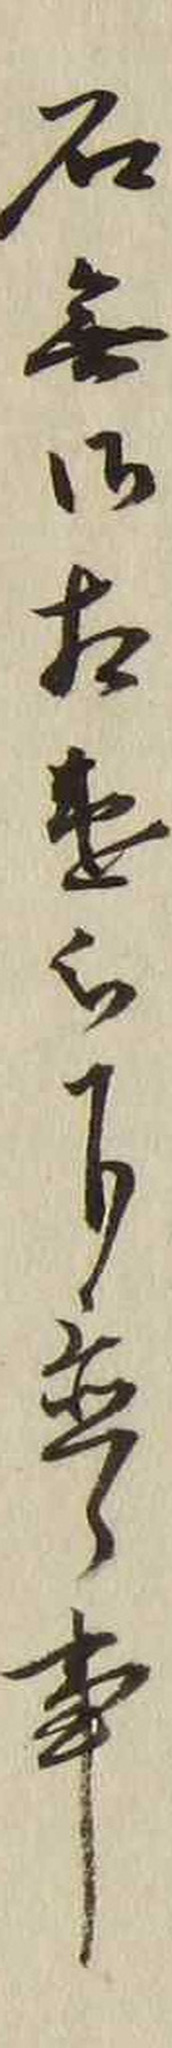石無御相違被下置候事

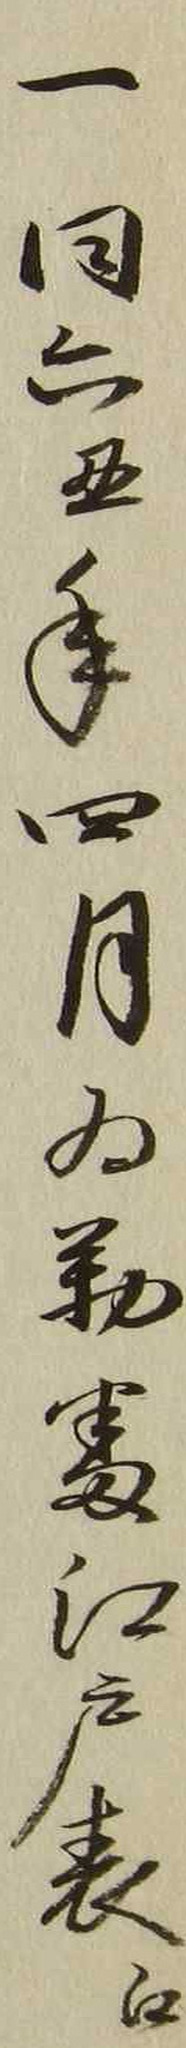一同六丑年四月為勤番江戸表江
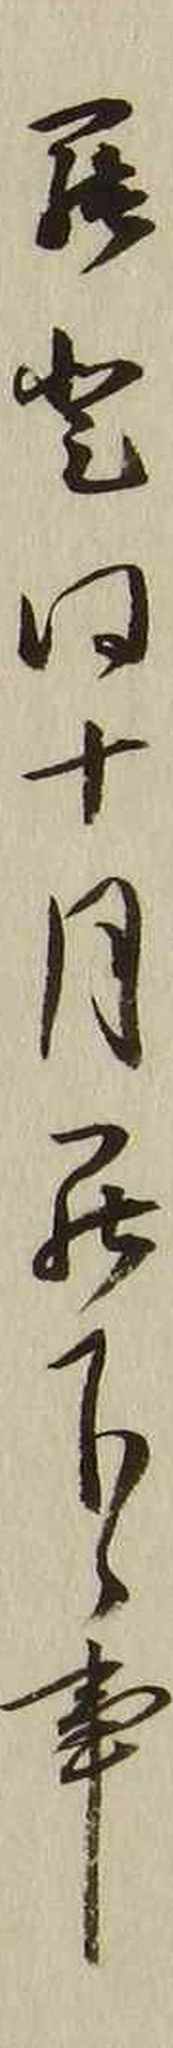罷登同十月罷下候事
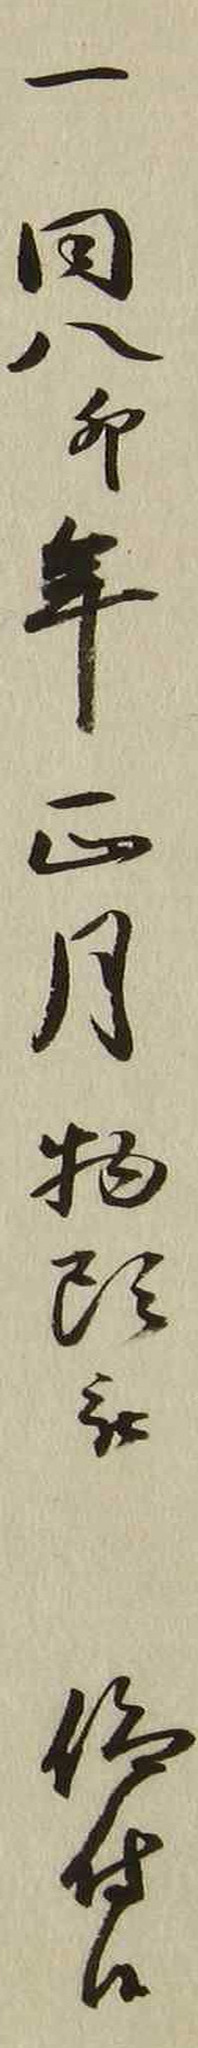一同八卯年正月物頭被仰付候
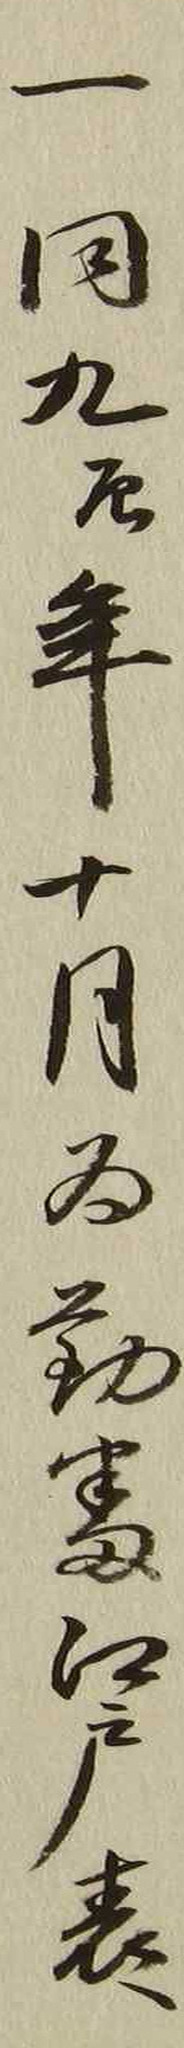一同九辰年十月為勤番江戸表へ
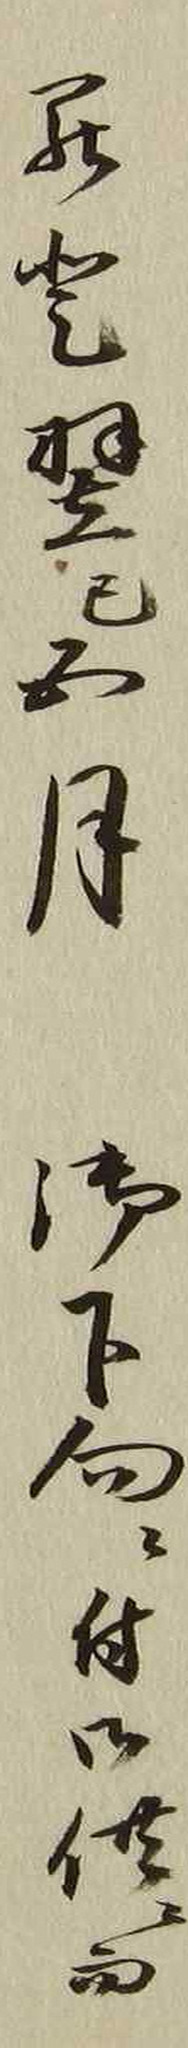罷登翌巳五月御下向ニ付御供ニ而
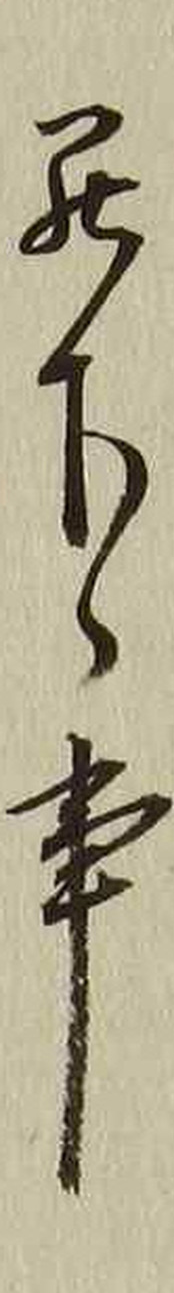罷下候事
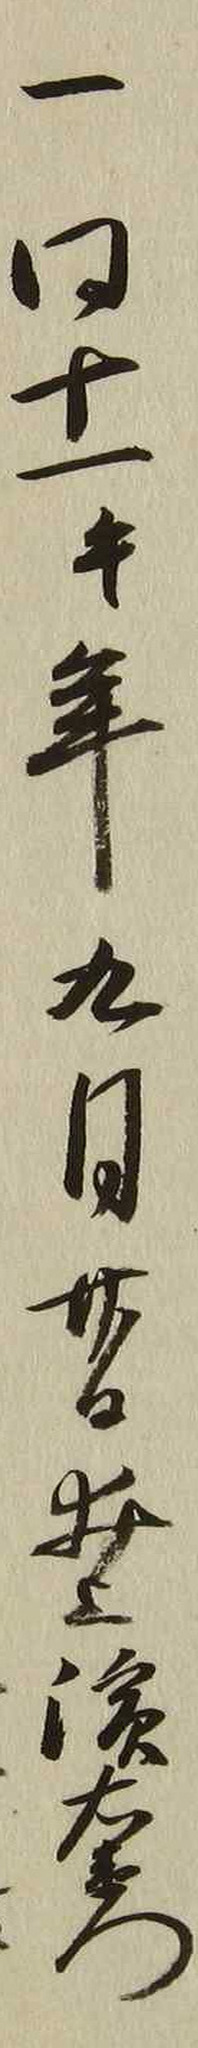一同十一午年九月廿日井上浜右衛門
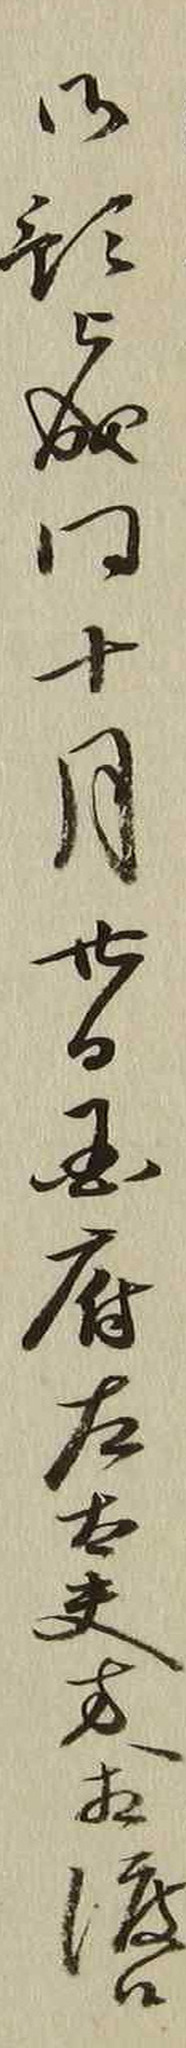御預被成同十月廿日国府左太夫方へ相渡候
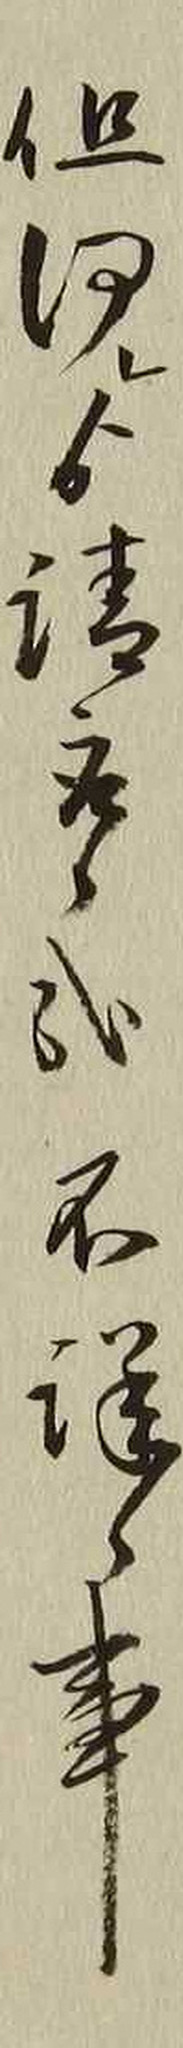但何レゟ請取候哉不詳候事
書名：諸士系譜　巻之69　を之部3
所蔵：会津若松市立会津図書館
